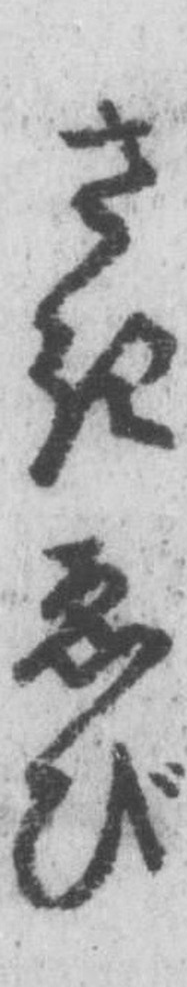さきゑび

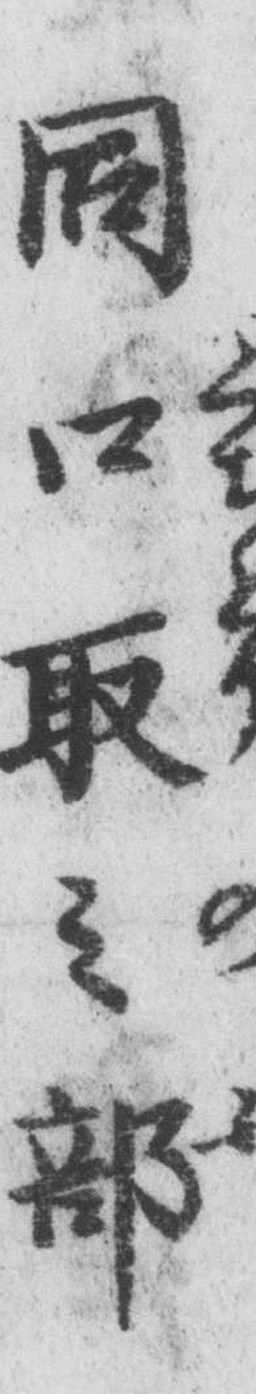同口取之部
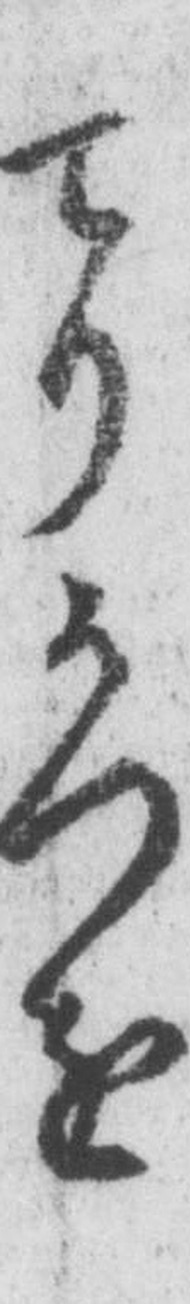てりかつを
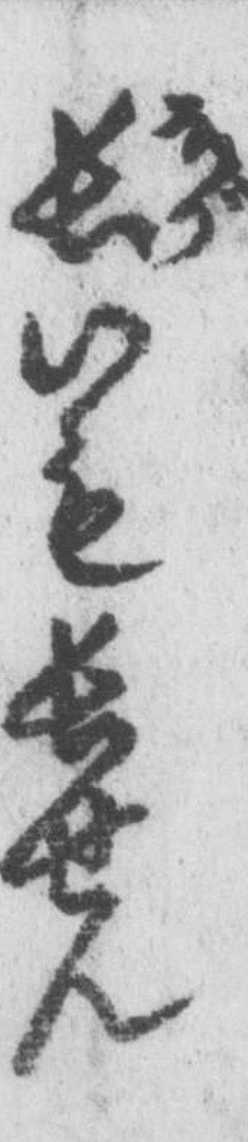長いも長せん
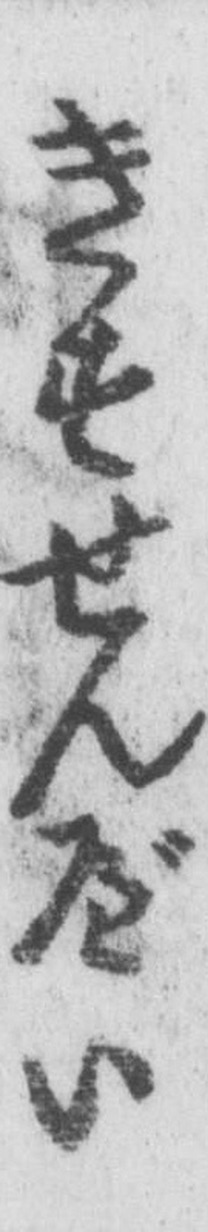きすせんべい
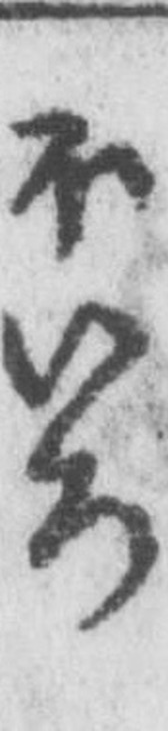ほいろ
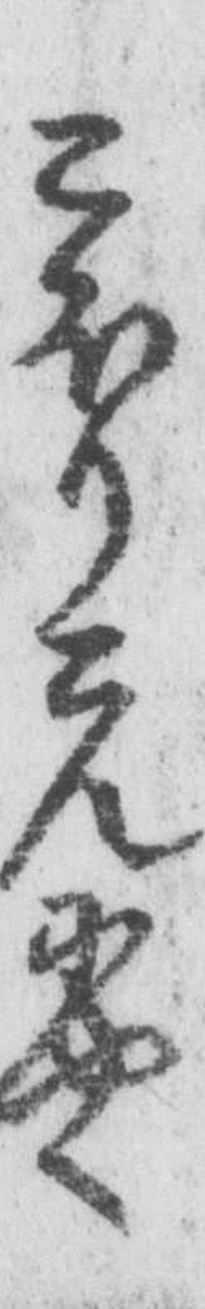こほりこんにやく
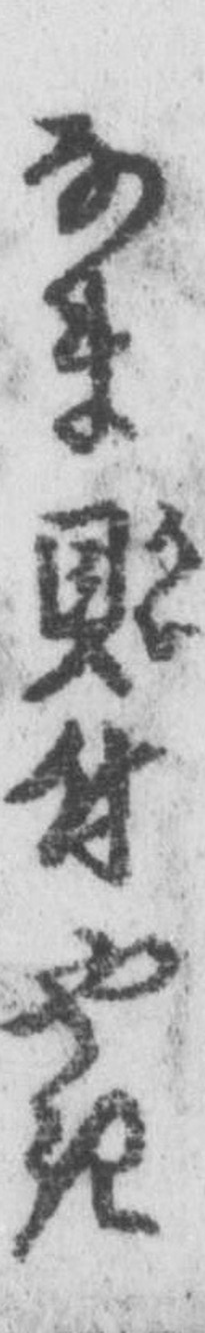なま貝付やき
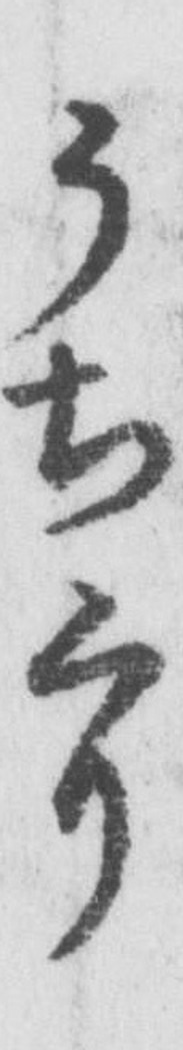かちくり
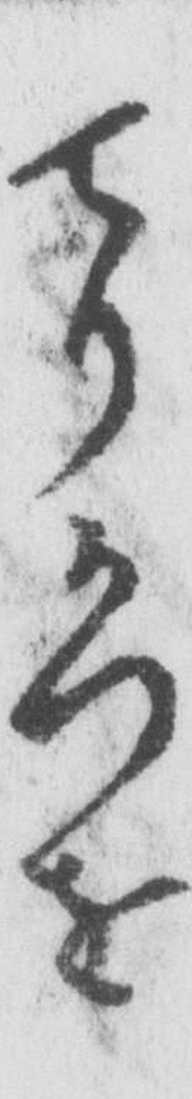てりかつを
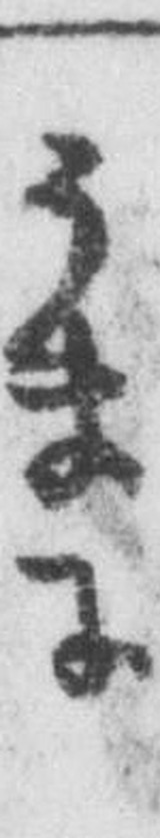うまに
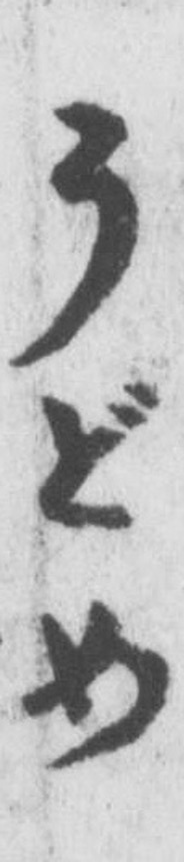うどめ
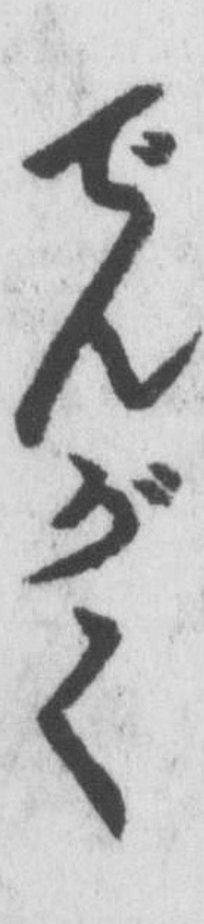でんがく
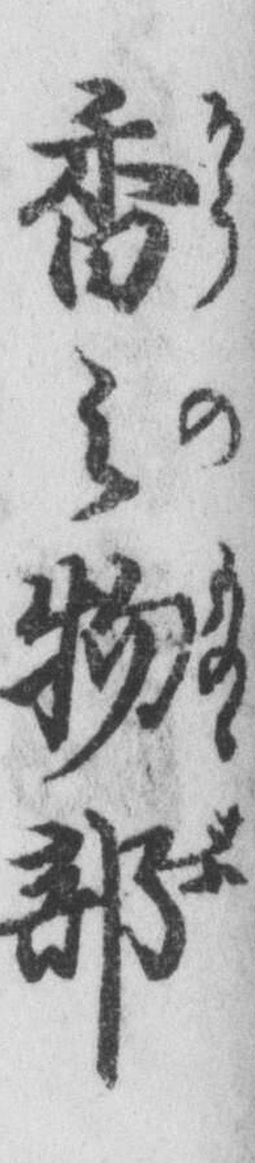番之物部
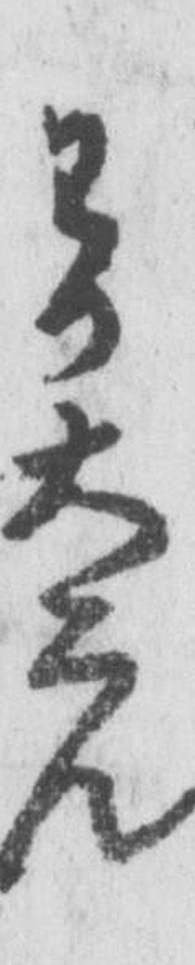わり大こん
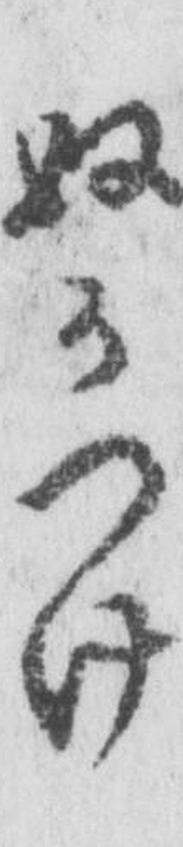ぬかつけ
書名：当世料理献立
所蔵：大阪府立大学学術情報センター 国文学研究資料館
